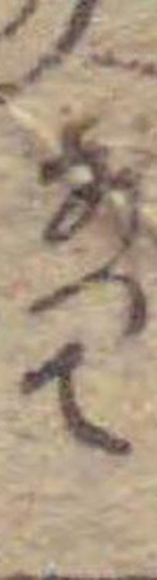なつて
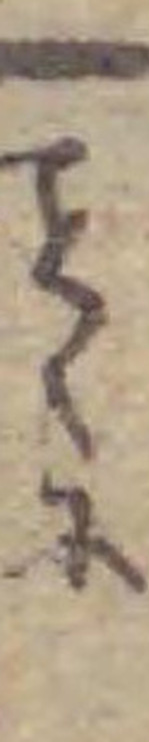ことくに
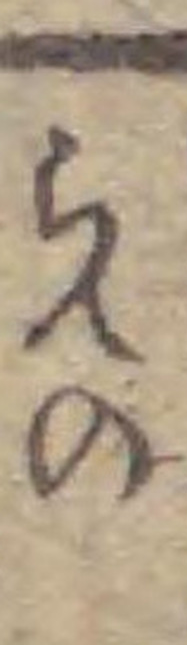らんの
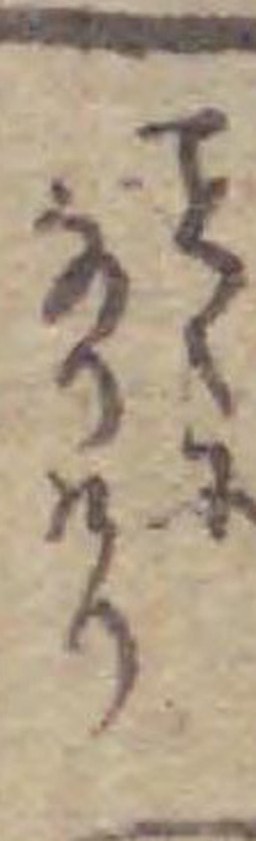なりけり

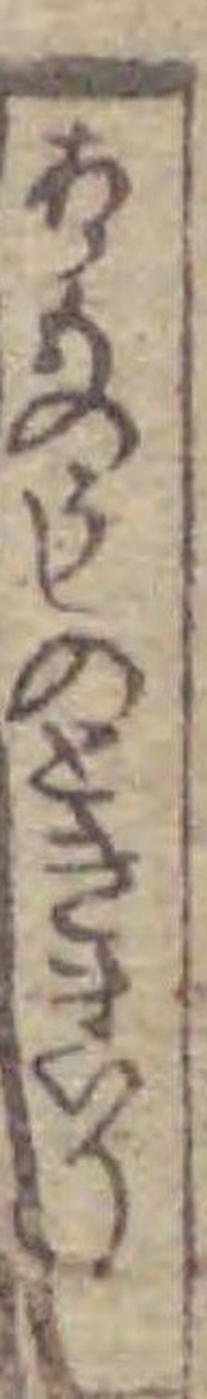あらものうしのときまいり
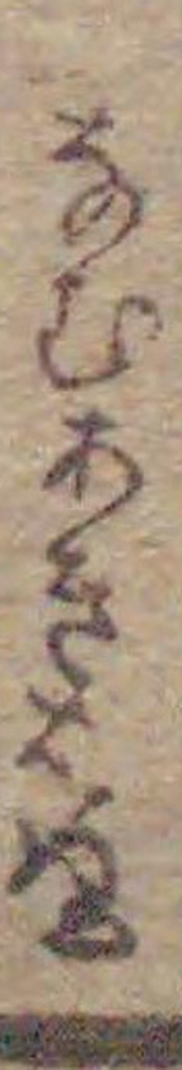なむあきはさま
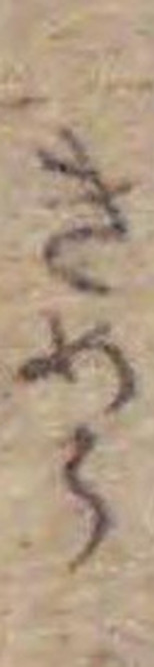きめう
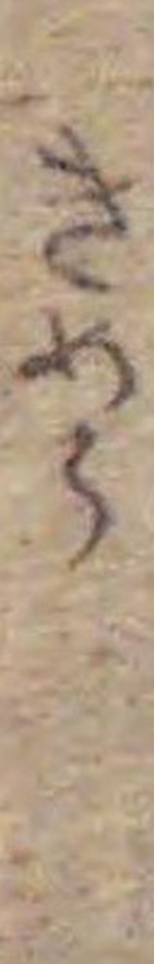きめう
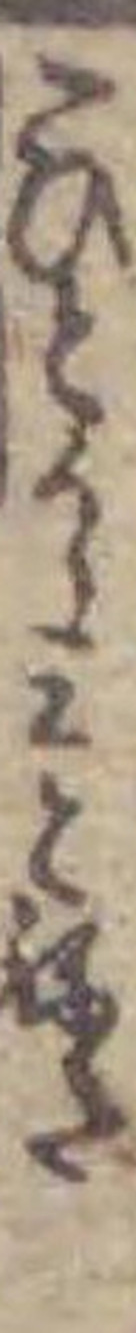こひとうらみとねた
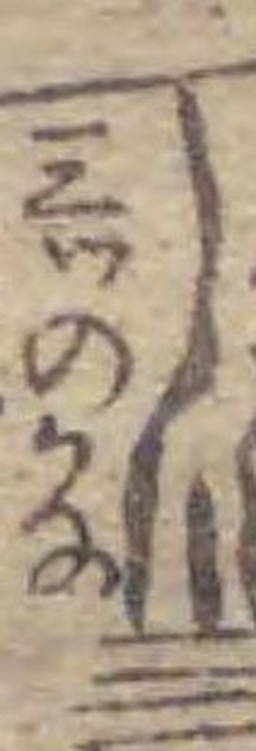三つのかな
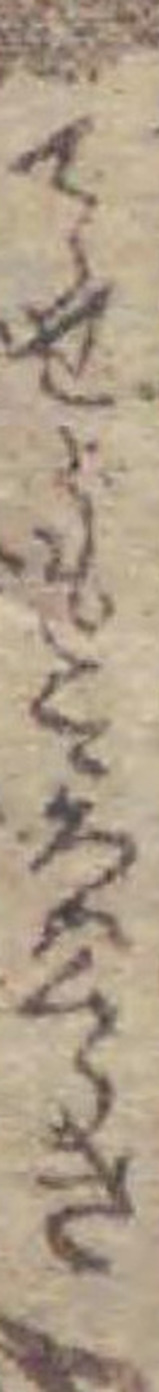てらせどもこゝろはくらき
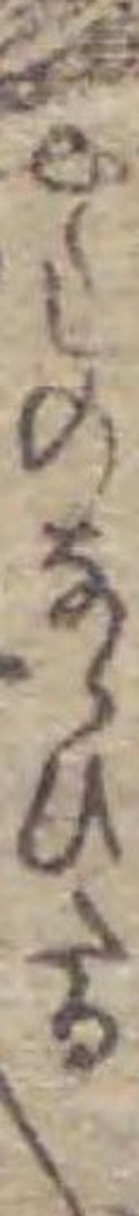やくしのならひたる
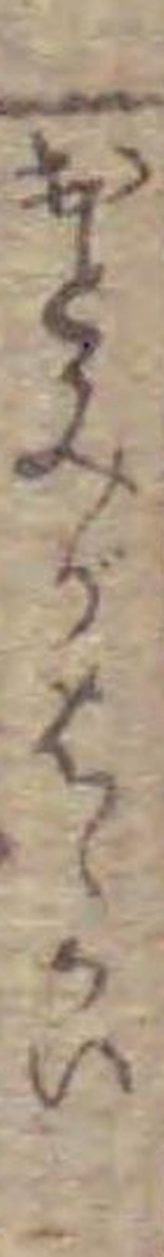おとみがはゝかい
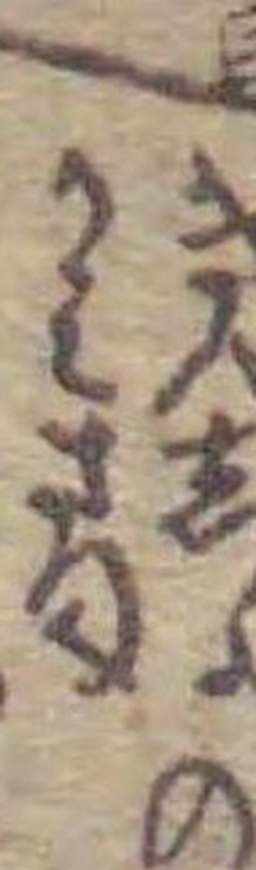かみさま
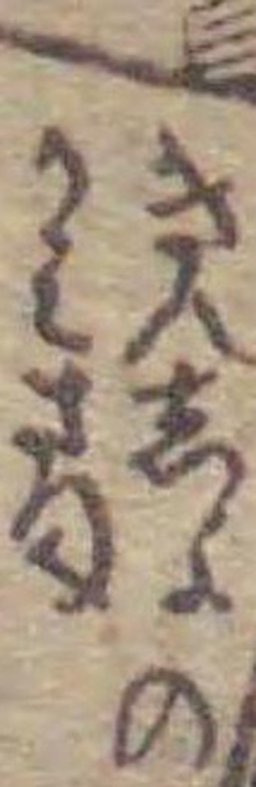かみさま
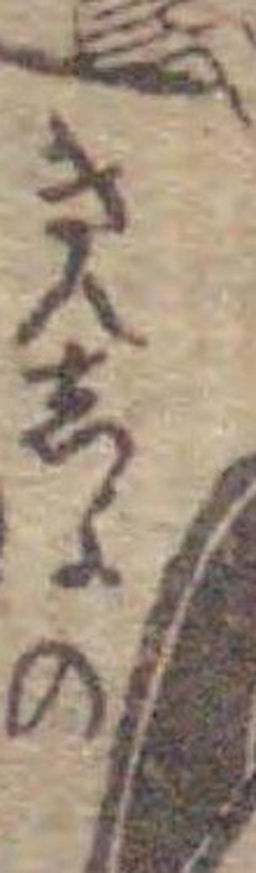きんしよの
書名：芸者呼子鳥 : 2巻（松泉堂）
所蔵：国立国会図書館 National Diet Library, JAPAN
